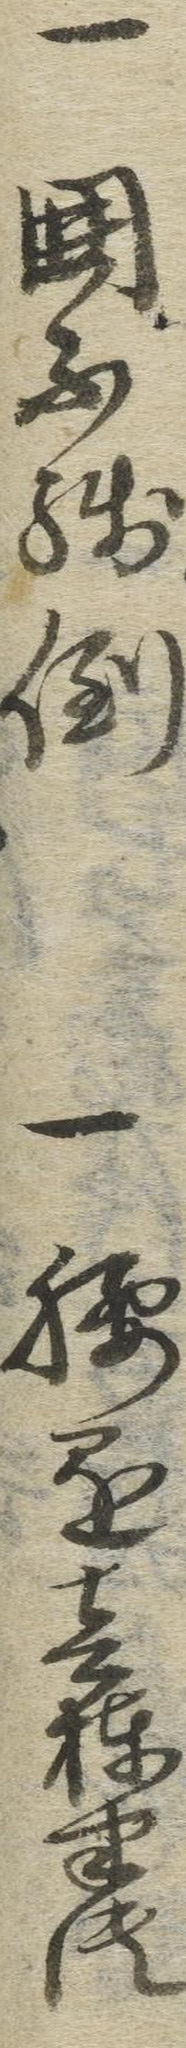一囲不残倒一腰掛壱棟半潰
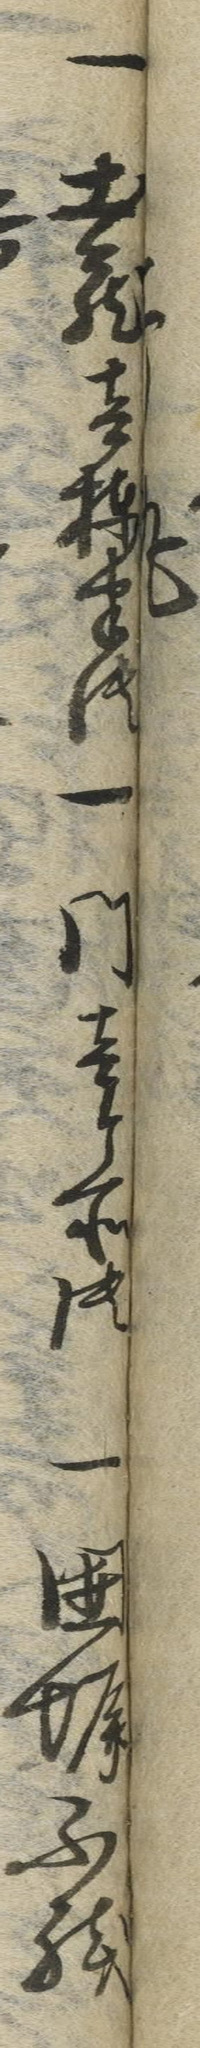一土蔵壱棟半潰一門壱ヶ所潰一囲塀不残
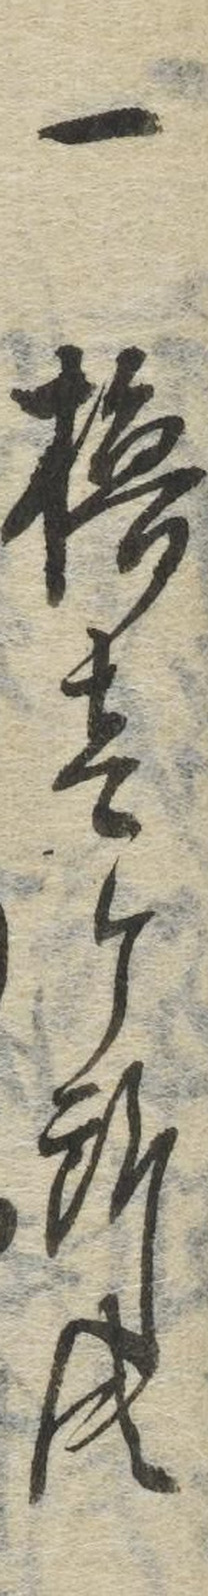一橋壱ヶ所潰
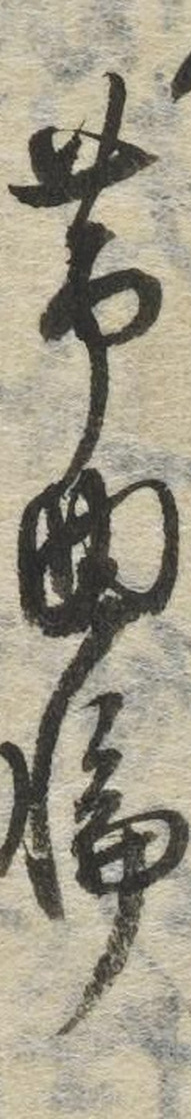帯曲輪
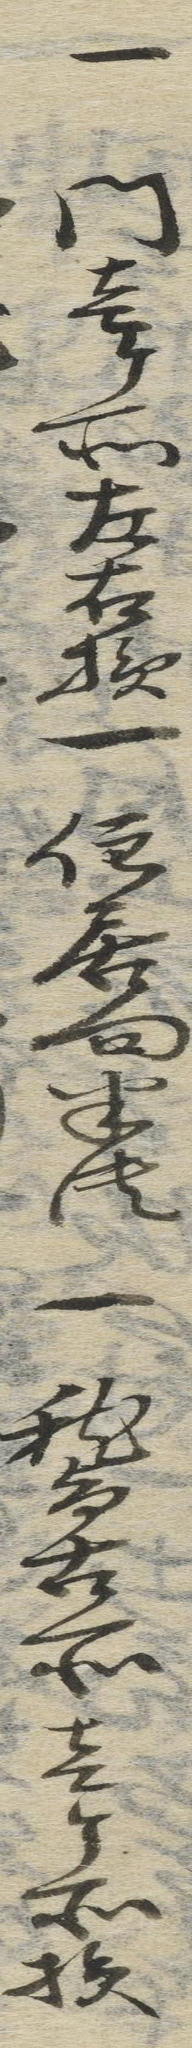一門壱ヶ所左右損一住居向半潰一稽古場壱ヶ所損
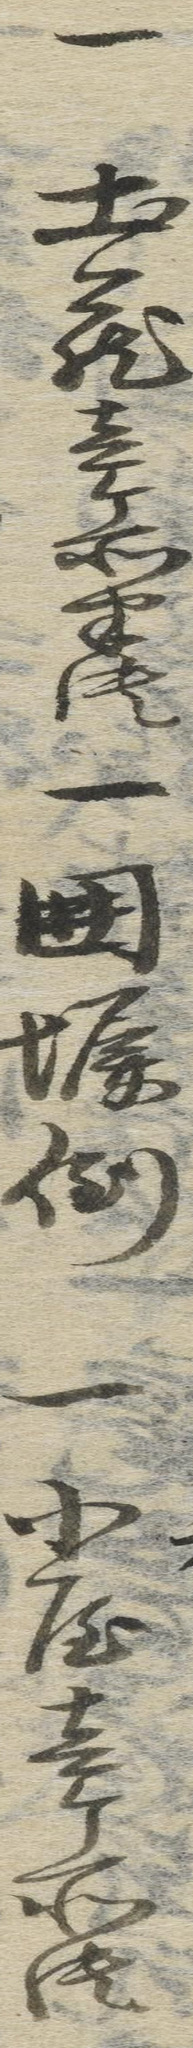一土蔵壱ヶ所半潰一囲塀倒一小屋壱ヶ所潰
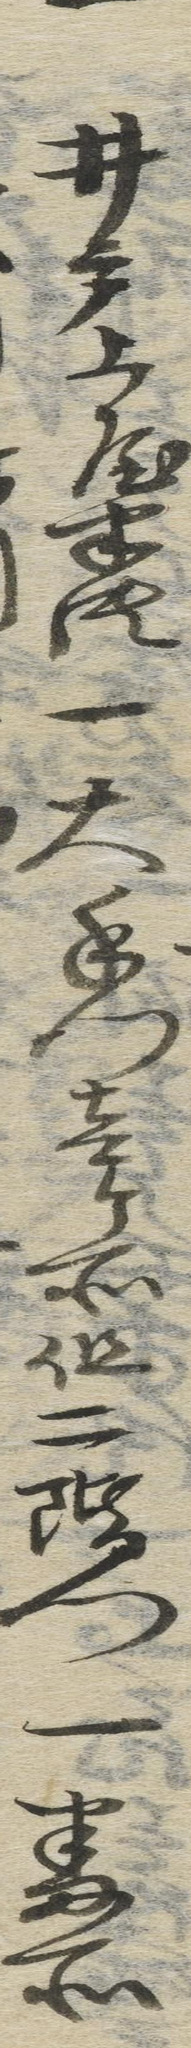一井戸上屋半潰一大手門壱ヶ所但二階門
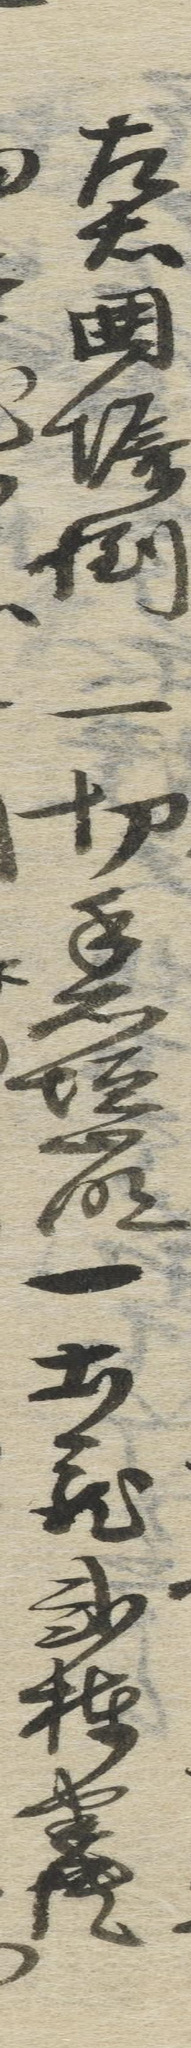一左右囲塀倒一切手石垣崩一土蔵弐棟半潰
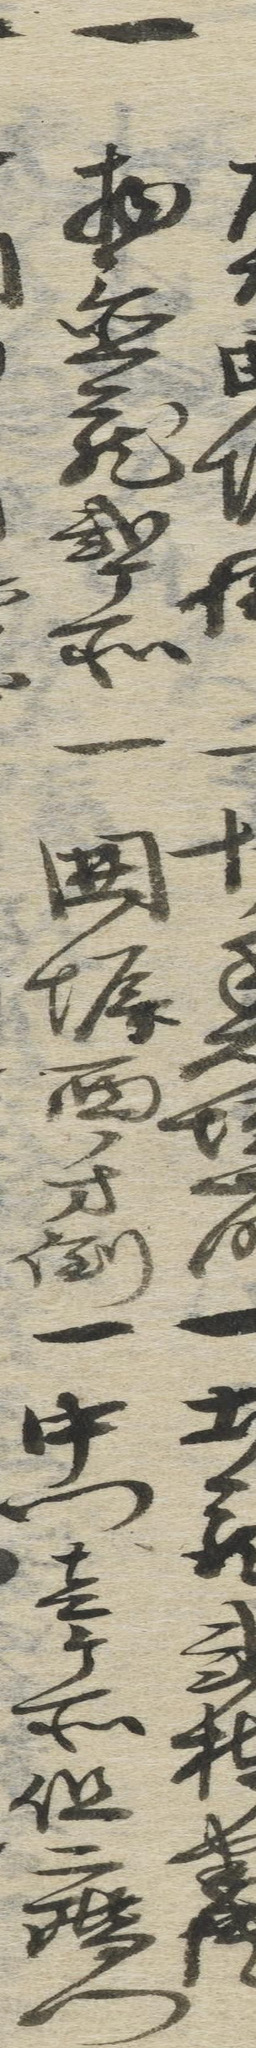一物置蔵弐ヶ所一囲塀西ノ方倒一表門壱ヶ所
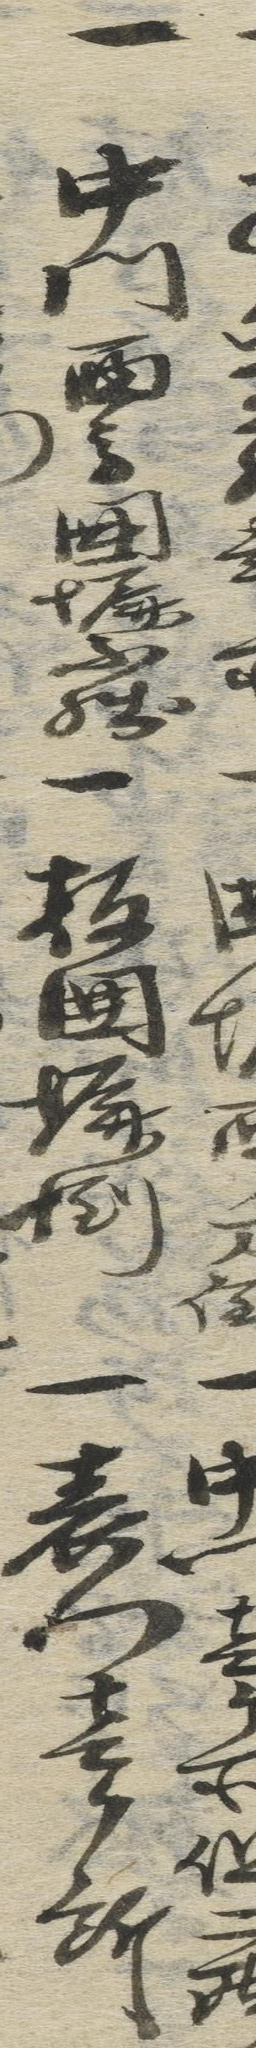一中門西之囲塀不残一板囲塀倒一表門壱ヶ所
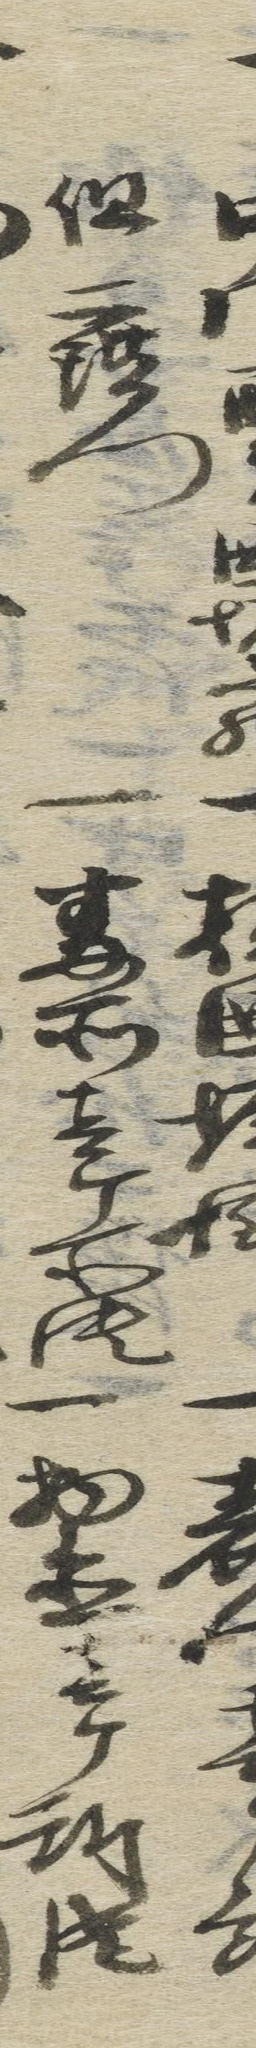但二階門一番所壱ヶ所潰一物置壱ヶ所潰
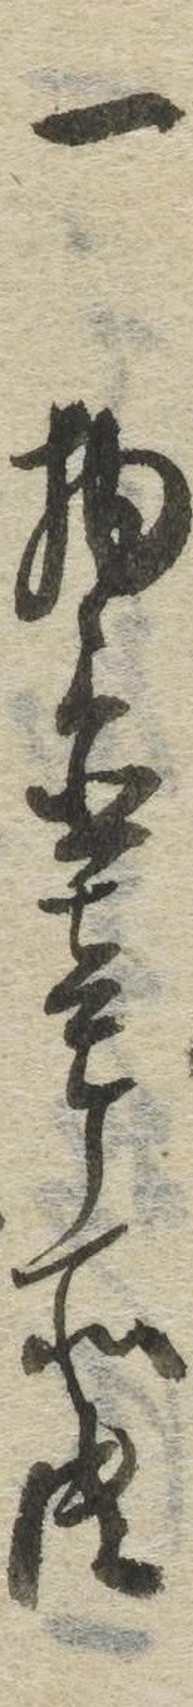一橋壱ヶ所潰
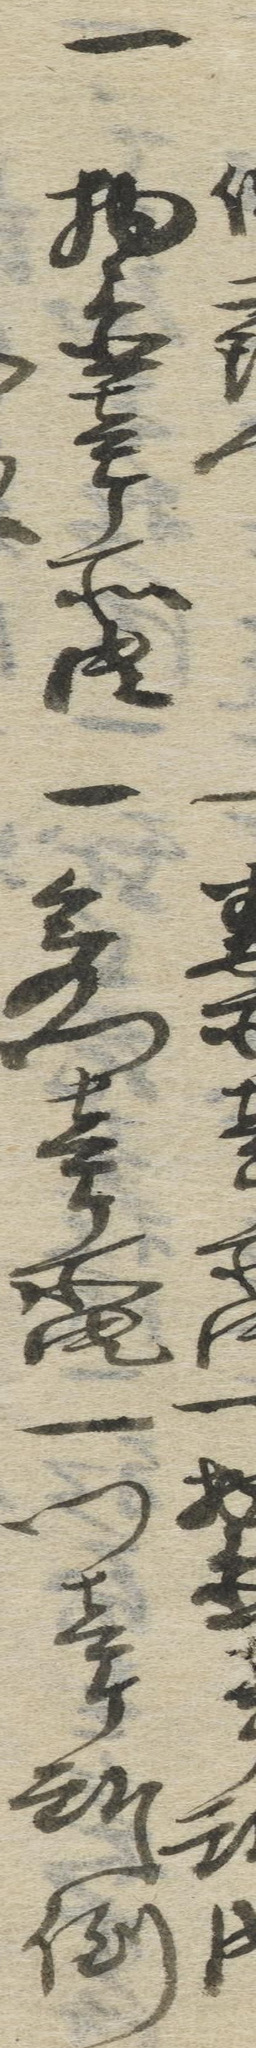一物置壱ヶ所潰一多門壱ヶ所潰一同壱ヶ所倒
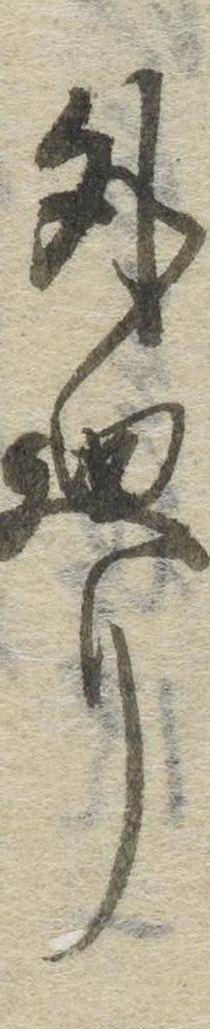外廻り
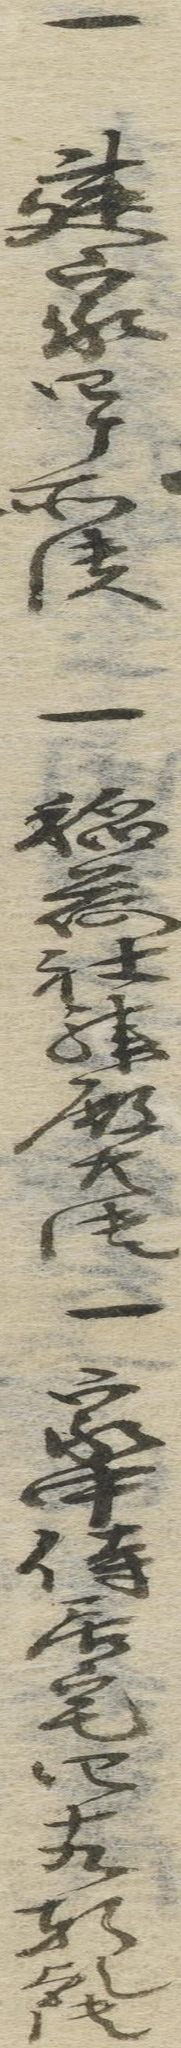一建家四ヶ所潰一稲荷社拝殿共潰一家中侍居宅四十九軒歟潰
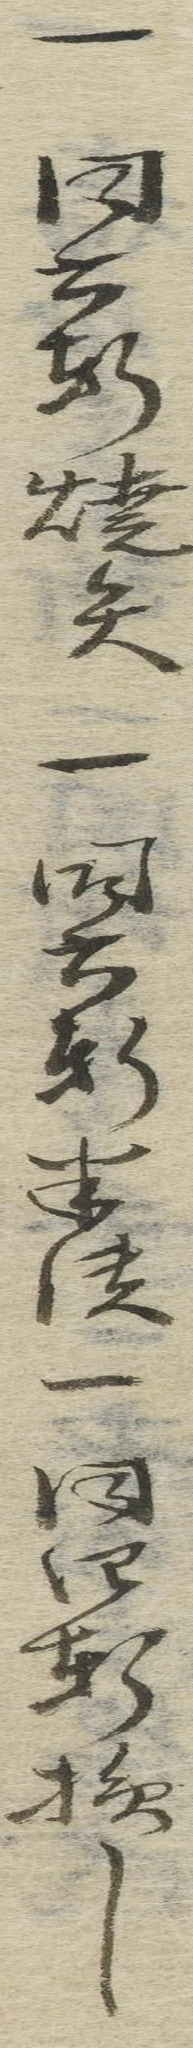一同六軒焼失一同六軒半潰一同四軒損し
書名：信濃越後　地震書留
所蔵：東京大学地震研究所図書室 Earthquake Research Institute Library, The University of Tokyo, JAPAN
